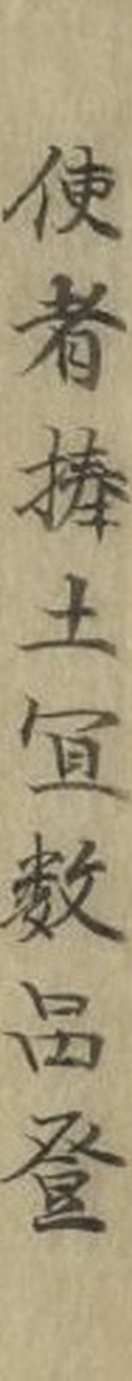使者捧土冝数品登
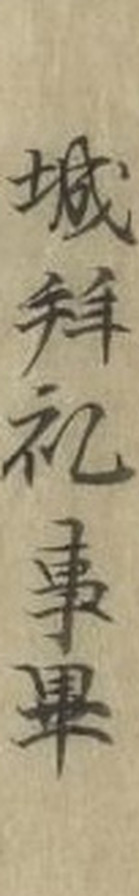城拝礼事畢
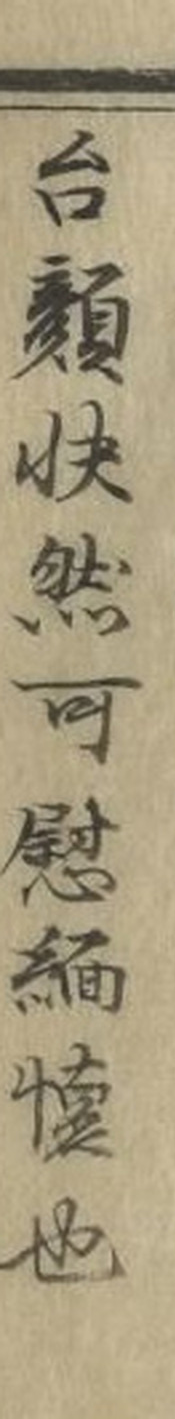台顔快可慰緬懐也
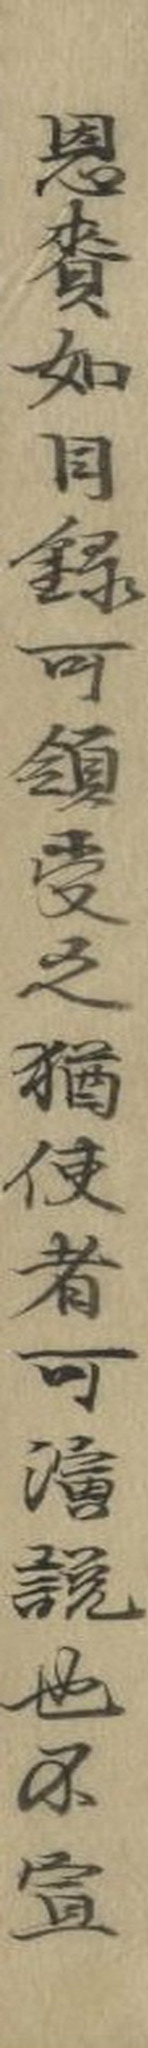恩賚如目録可領受之猶使者可演説也不宣

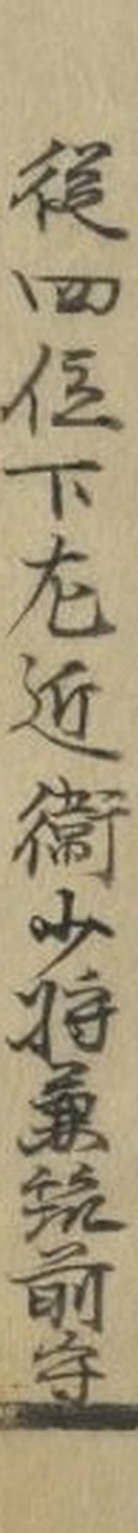従四位下左近衛少将兼筑前守
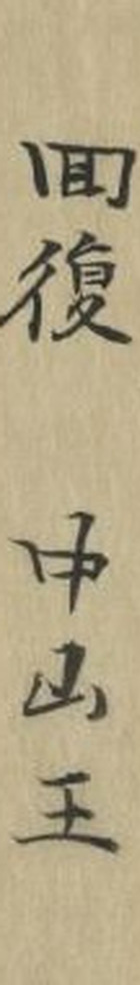回復中山王
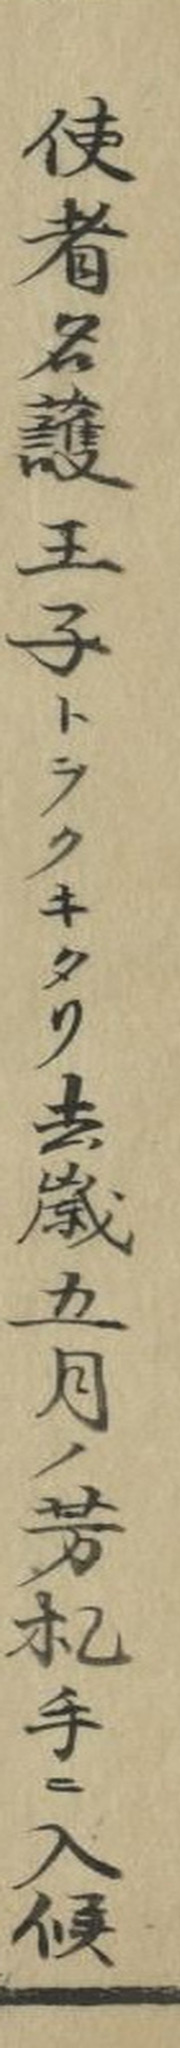使者名護王子トラクキタリ去歳五月ノ芳札手二入候
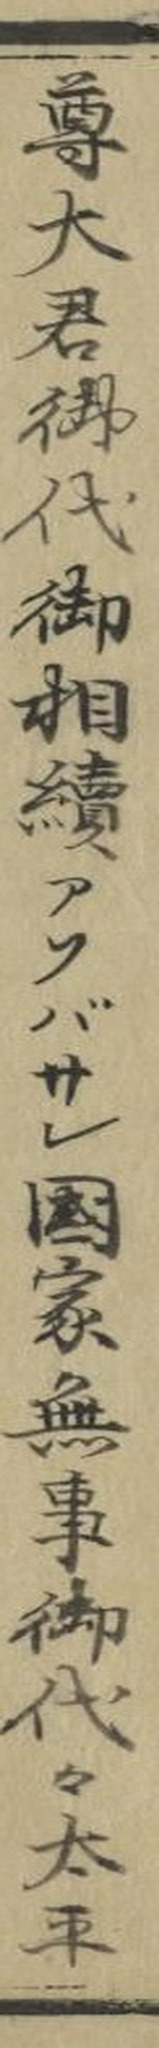尊大君御代御相続アソバサレ国家無事御代々太平
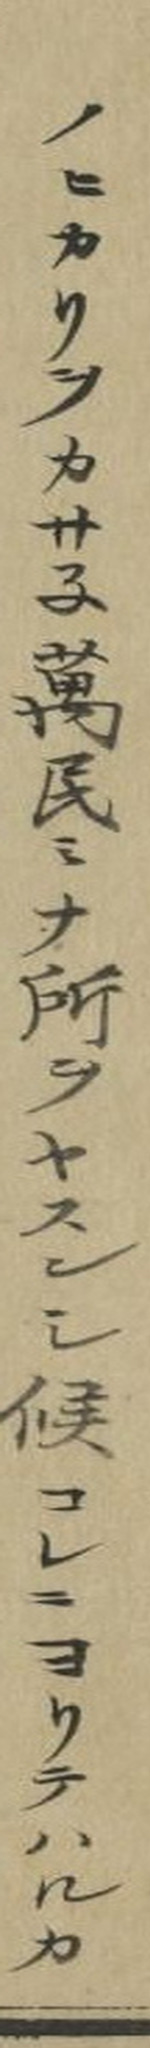ノヒカリヲカサネ万民ミナ所ヲヤスンシ候コレニヨリテハルカ
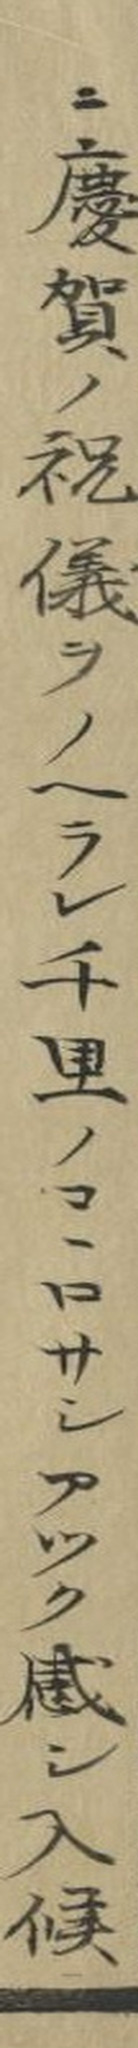ニ慶賀ノ祝儀ヲノヘラレ千里ノコ丶ロ屮サシアツク
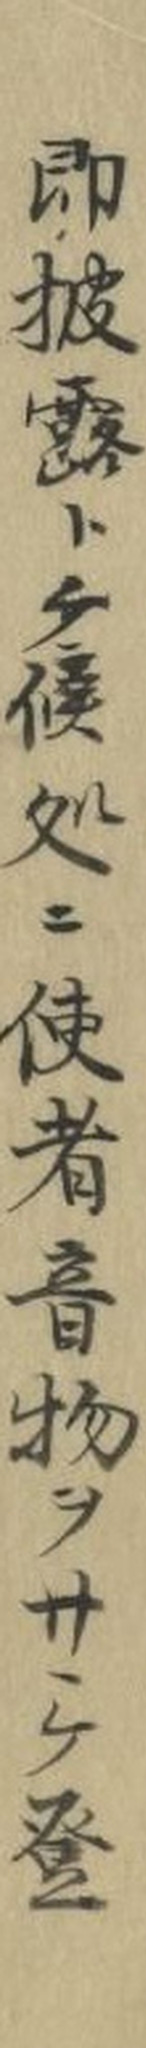即披露トケ候処ニ使者音物ヲケ登
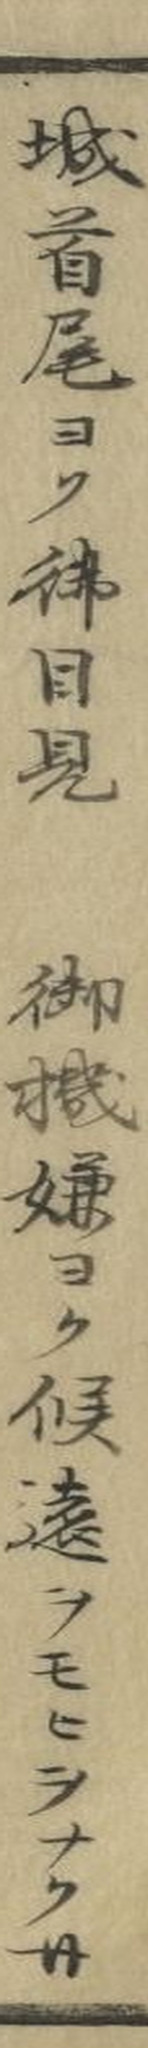城首尾ヨク御目見御機嫌ヨク候遠ヲモヒヲナクサ
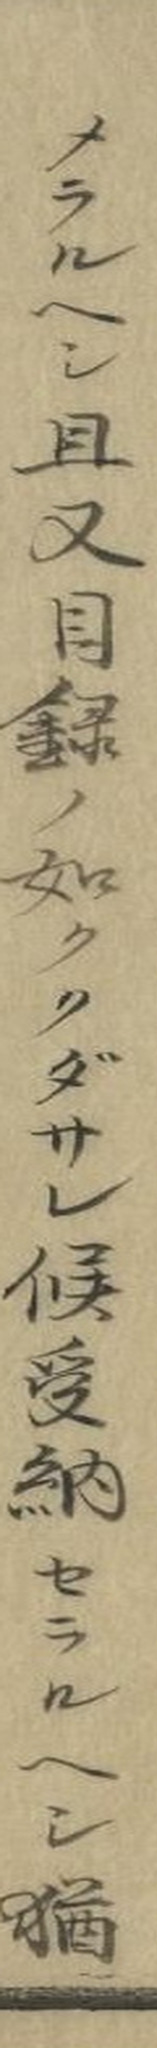メラルヘシ且又目録ノ如ククダサレ候受納セラルヘシ猶
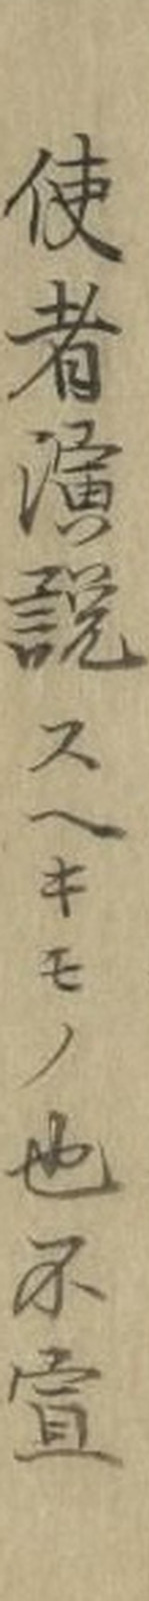使者演説スへキモノ也不宣
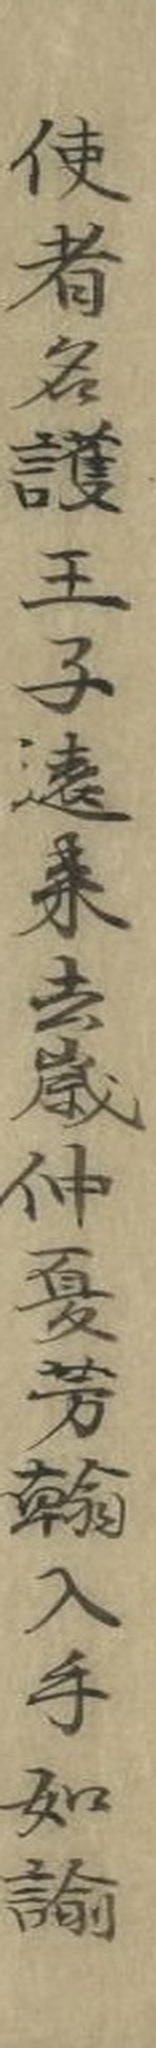使者名護王子遠来去歳仲夏芳翰入手如諭
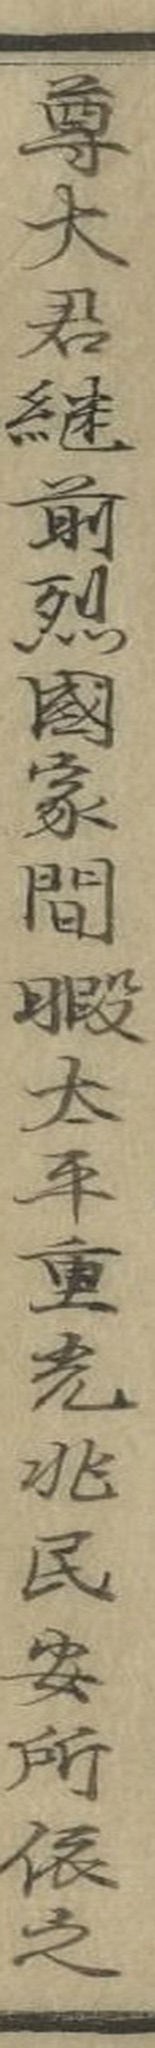尊大君継前列国家間暇太平重光兆民安所依之
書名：琉球往来（下）
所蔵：University of the Ryukyus Library
